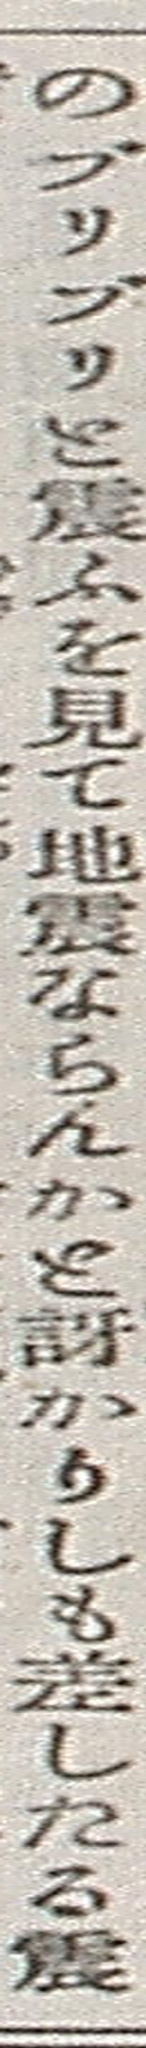のブリブリと震ふを見て地震ならんかと訝かりしも差したる震
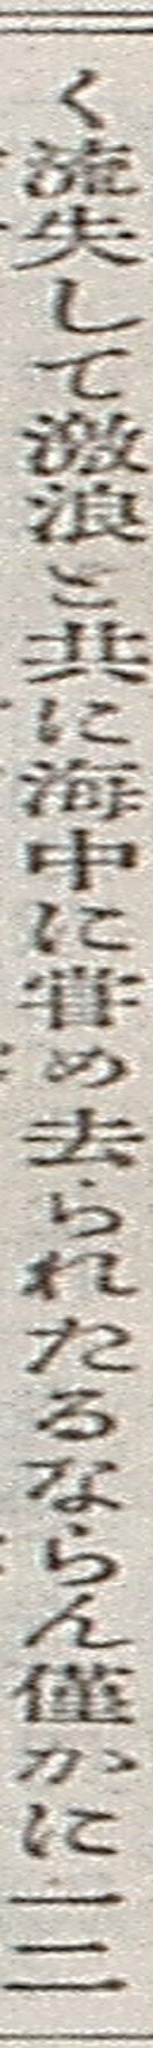く流失して激浪と共に海中に嘗め去られたるならん僅かに一二
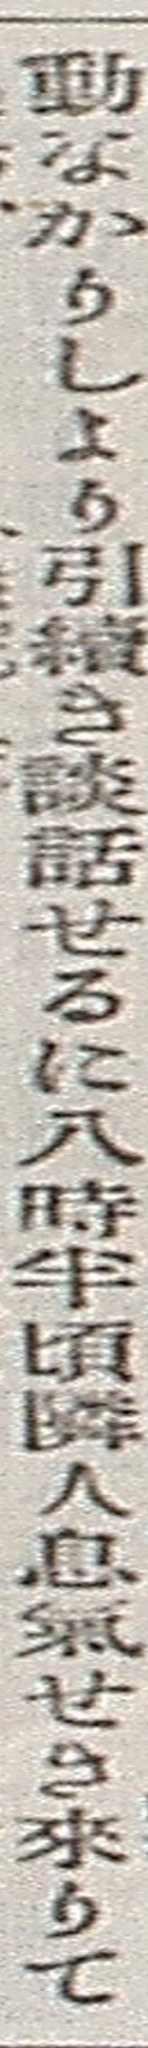動なかりしより引続き談話せるに八時半頃隣人息気せき来りて
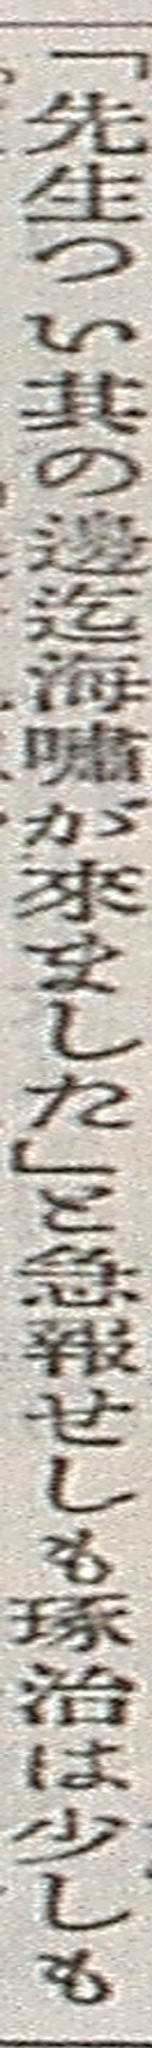「先生つい其の辺迄海嘯が来ました」と急報せしも琢治は少しも
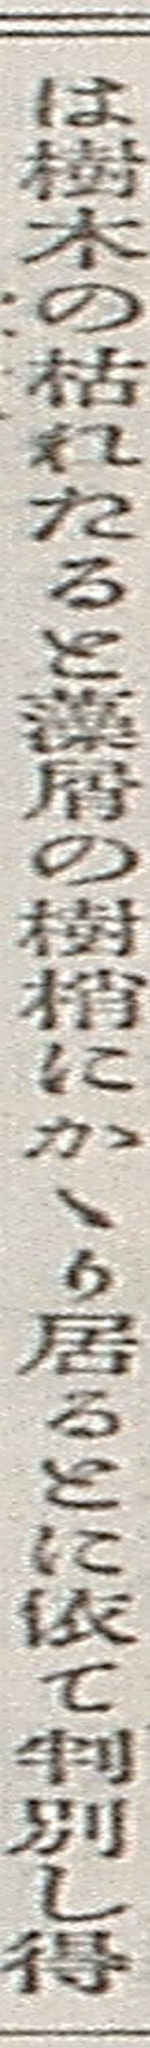は樹木の枯れたると藻屑の樹梢にかゝり居るとに依て判別し得
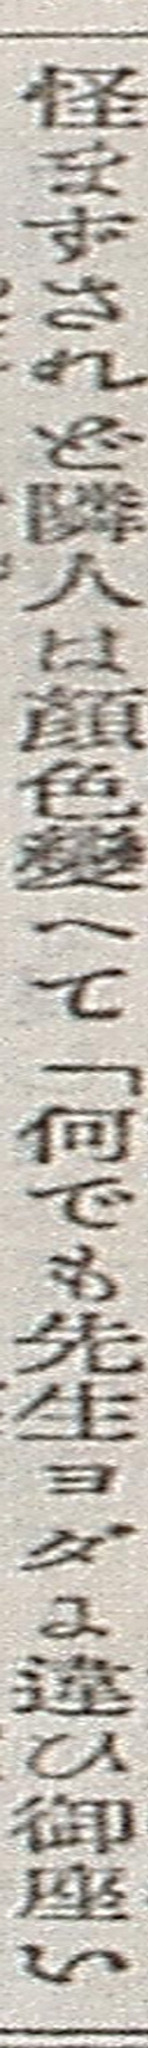怪まずされど隣人は顔色変へて「何でも先生ヨダに違ひ御座い
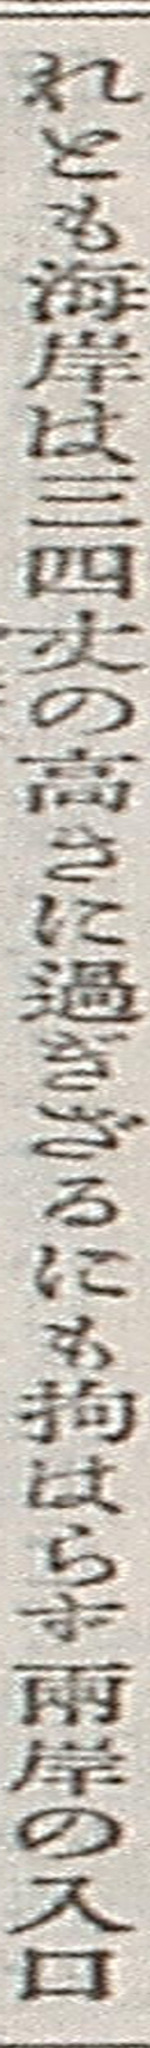れとも海岸は三四丈の高きに過ぎざるにも拘はらず両岸の入口
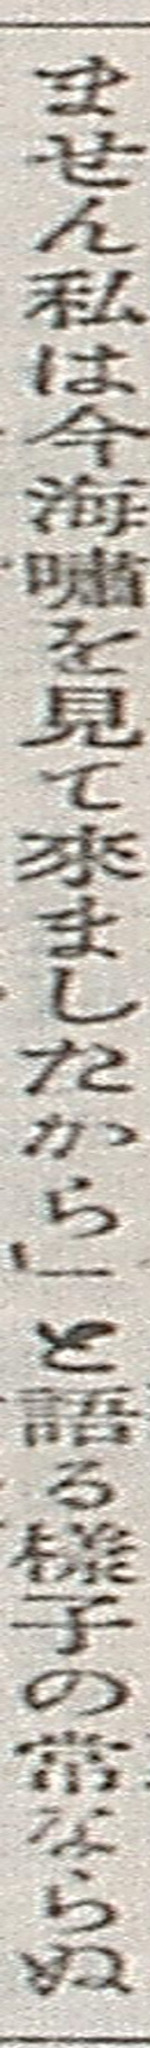ません私は今海嘯を見て来ましたから」と語る様子の常ならぬ
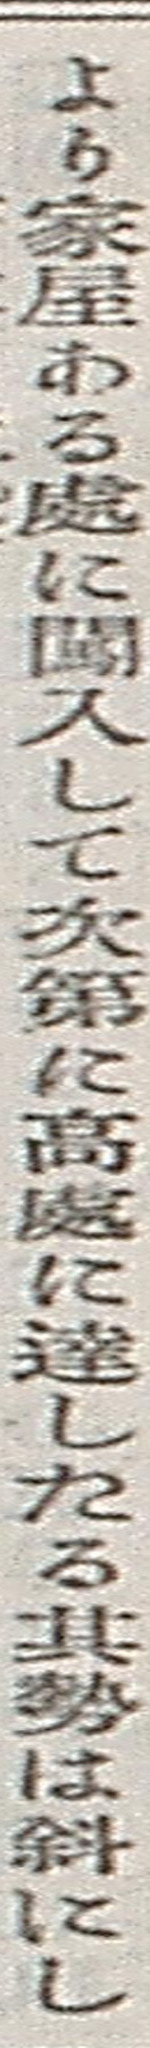より家屋ある処に闖入して次第に高処に達したる其勢は斜にし
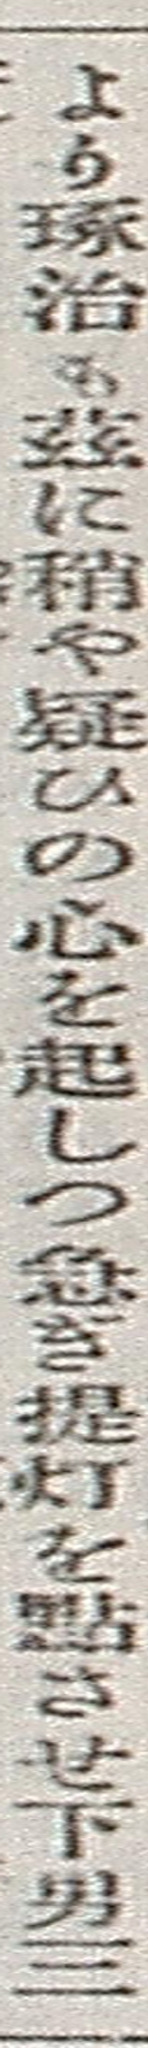より琢治も茲に稍や疑ひの心を起しつ急ぎ提灯を点させ下男三
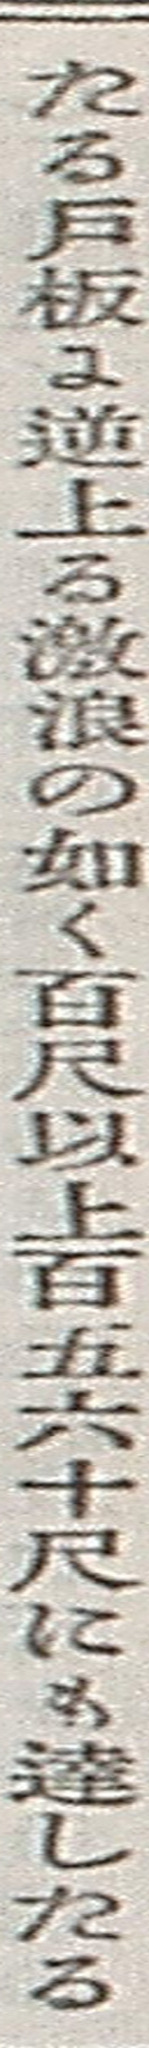たる戸板に逆上る激浪の如く百尺以上百五六十尺にも達したる
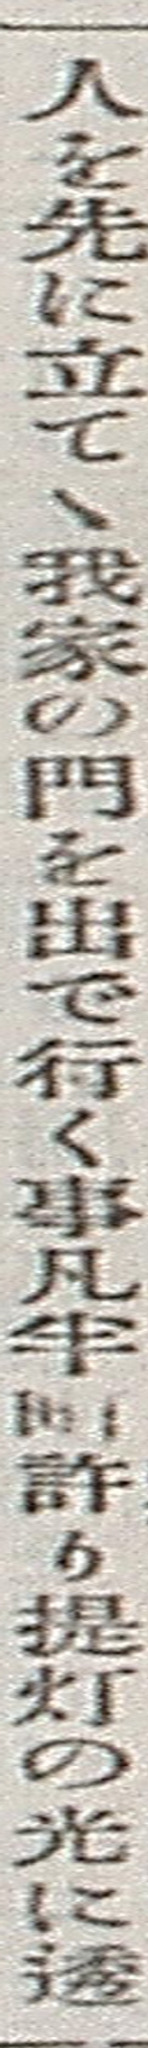人を先に立てゝ我家の門を出で行く事半町許り提灯の光に透

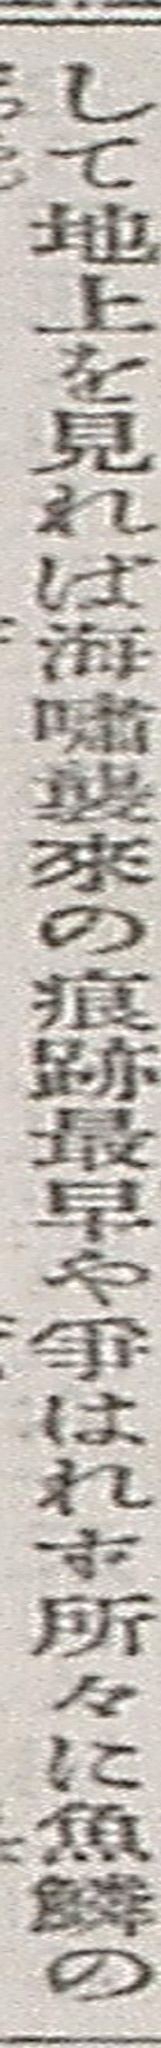して地上を見れば海嘯襲来の痕跡最早や争はれず所々に魚鱗の
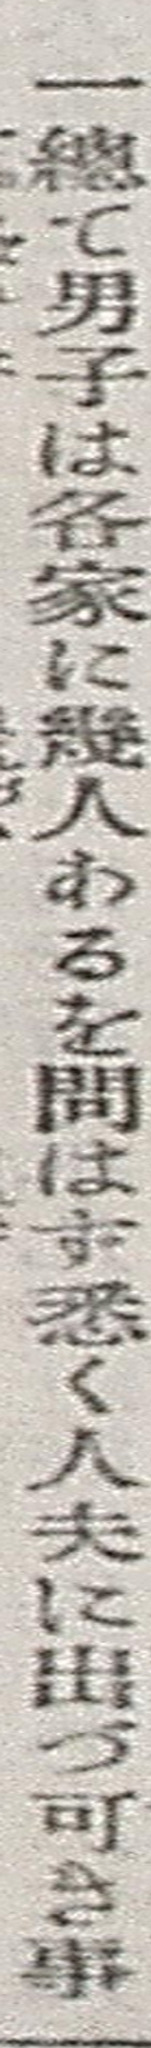一総て男子は各家に幾人あるを問はず悉く人夫に出づ可き事
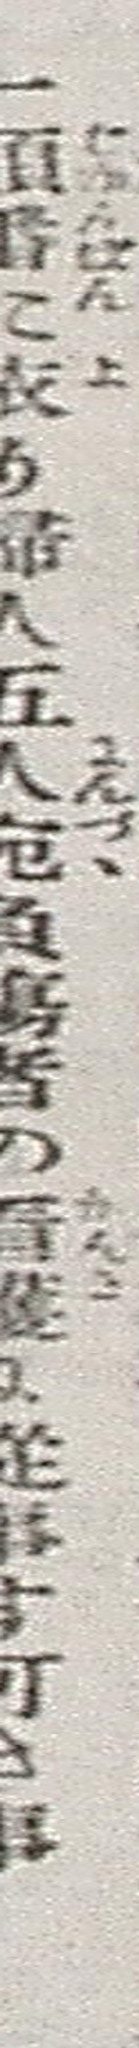一順番に依り婦人五人宛負傷者の看護に従事す可き事
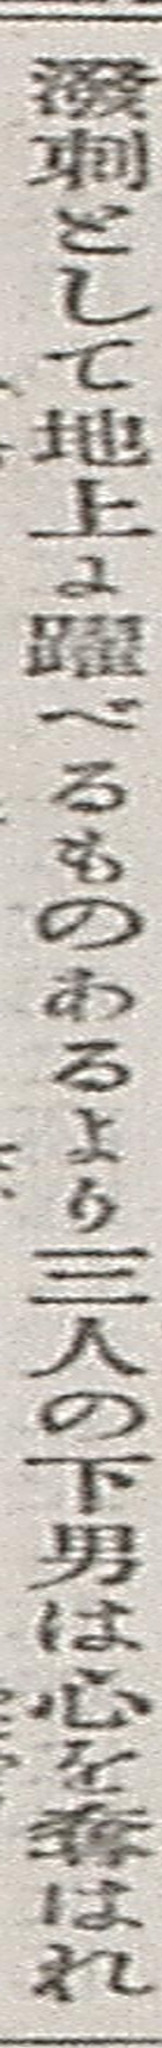溌剌として地上に躍べるものあるより三人の下男は心を奪はれ
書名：風俗畫報臨時増刊第百二十號　大海嘯被害録（下）
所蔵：東京大学地震研究所図書室 Earthquake Research Institute Library, The University of Tokyo, JAPAN
